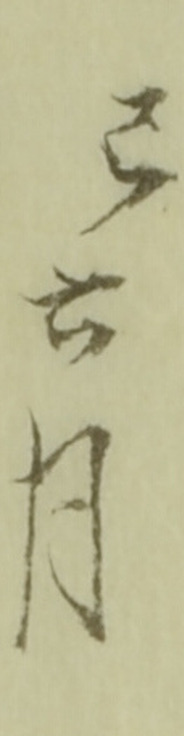巳六月
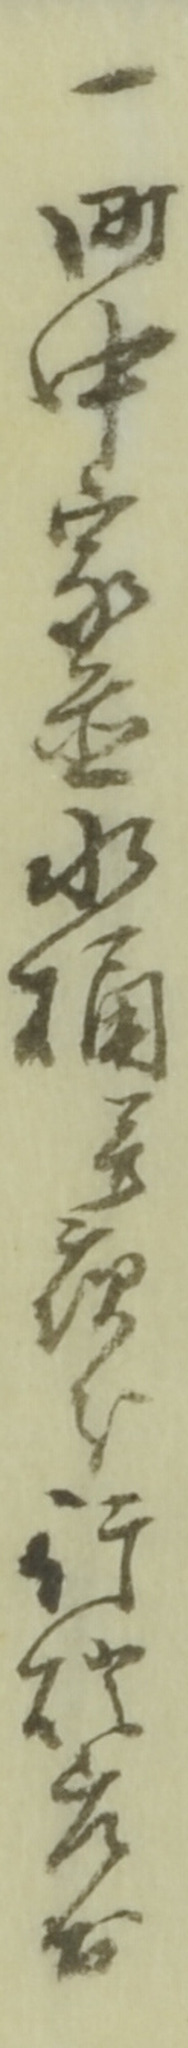一町中家置水桶幷夜分行灯差出
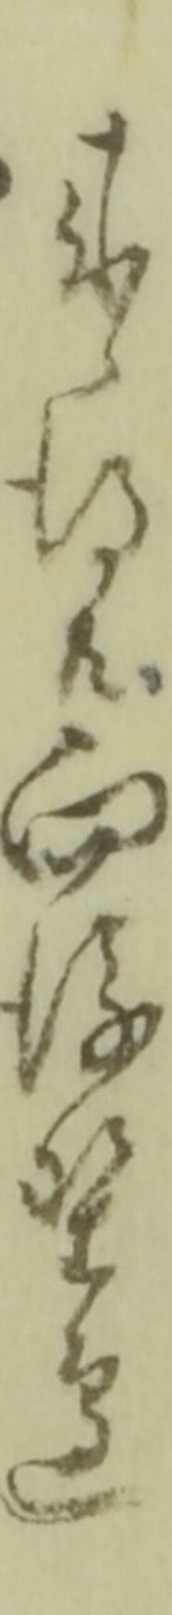来候得共向後野辺
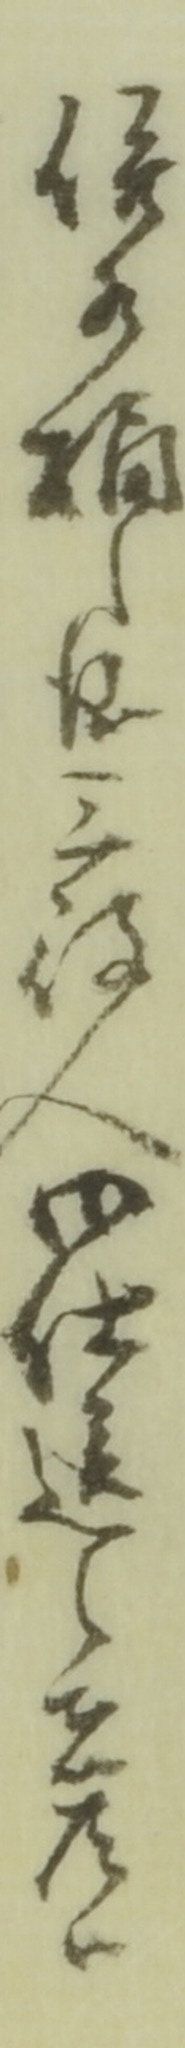併水桶之儀三役人御仕送候者共ハ
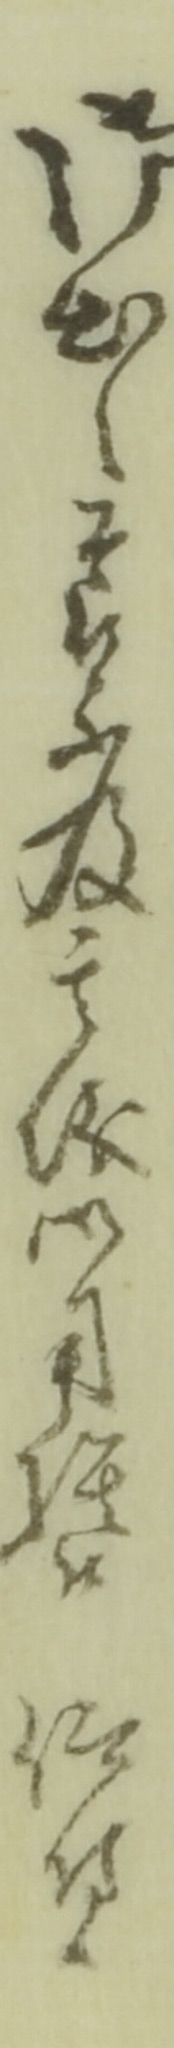御出之節不及其儀御用捨被仰付候
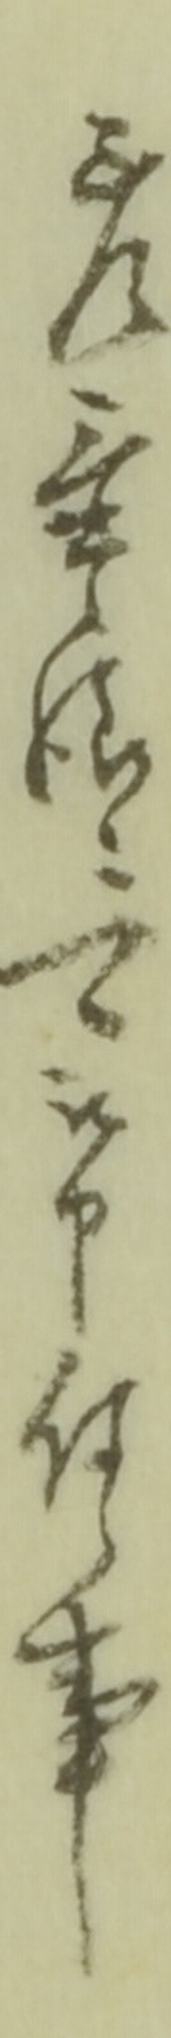差置候様ニ可被申付候事
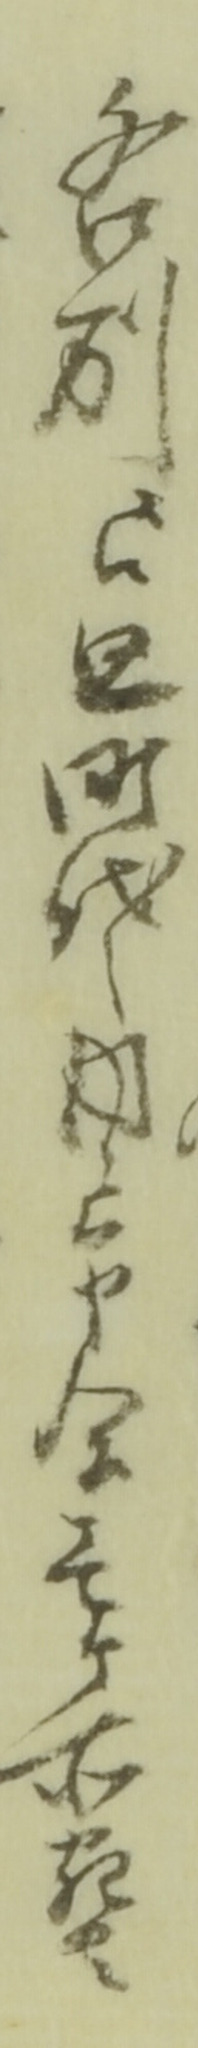各別ニ候且町代之内被申合壱ヶ所宛二
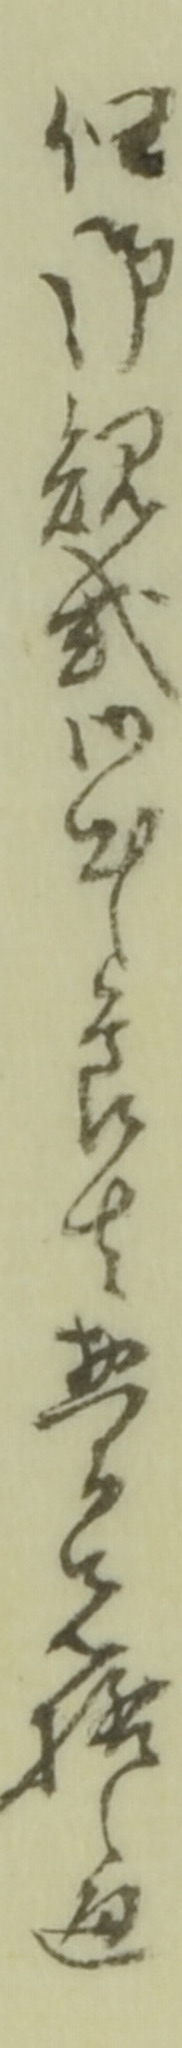但御親式御出候節者惣而先格之通
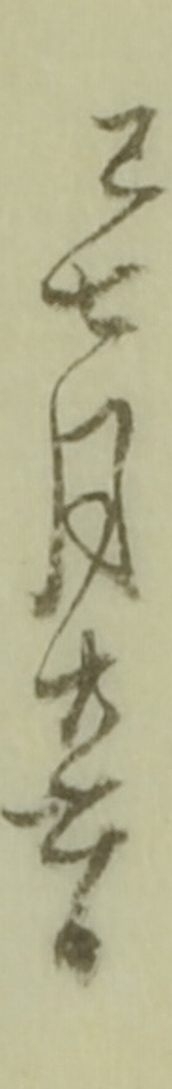巳七月廿六日

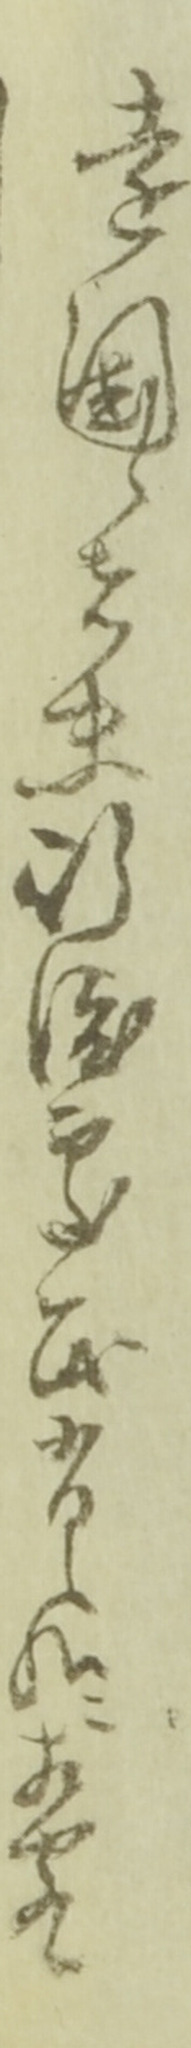遠国候者未だ行渡處茂有之候様二相聞候
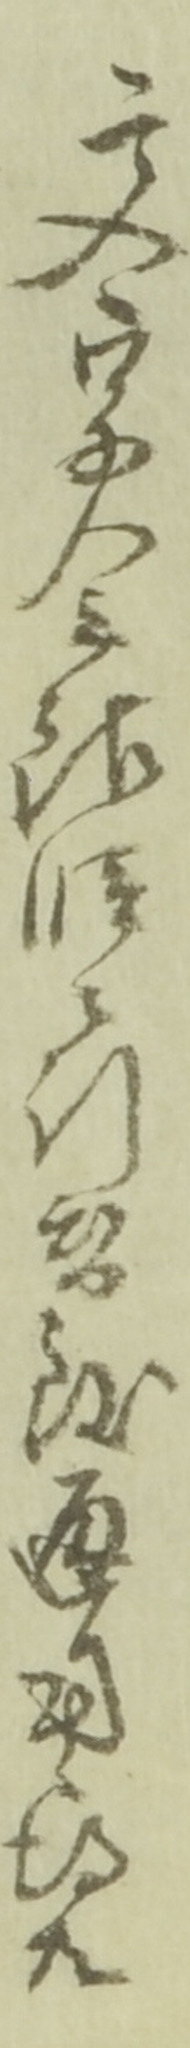文字金銀縦ェ引替致通用候得共
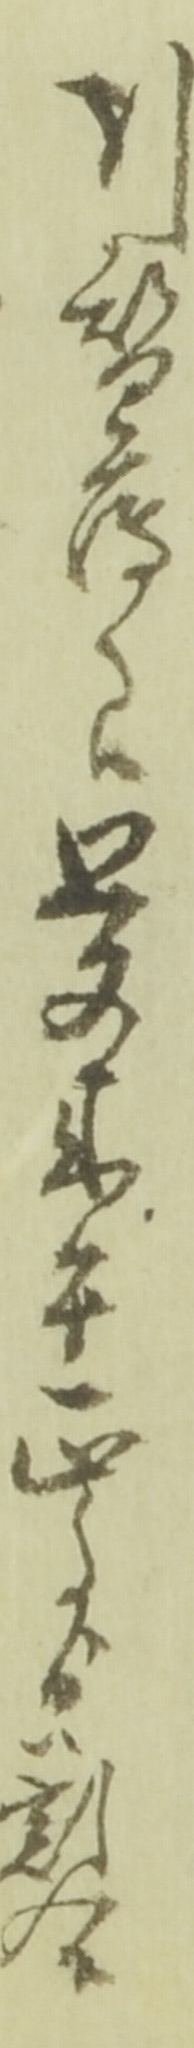引替戻候是又来午正月よりハ割合
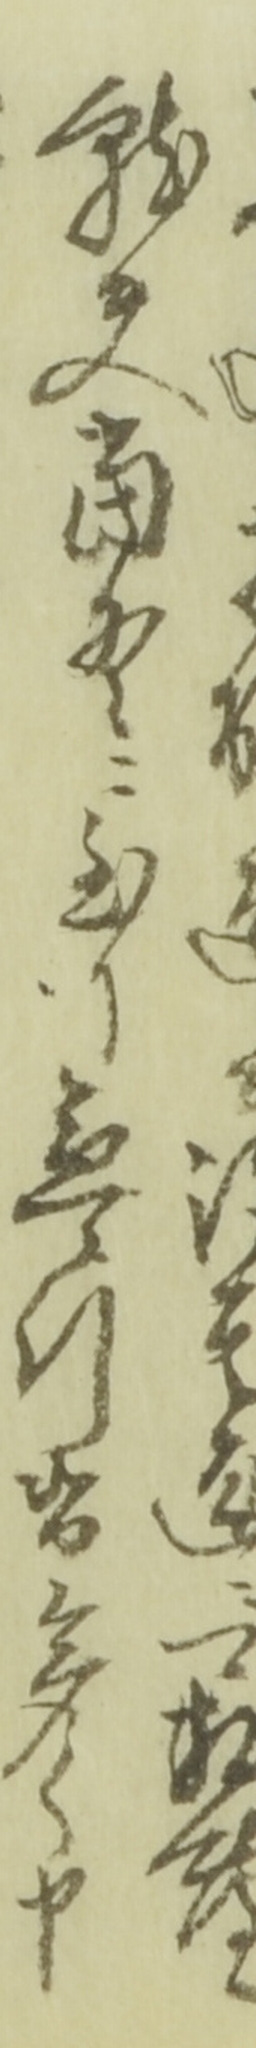就夫当冬二至り急二引替多く申
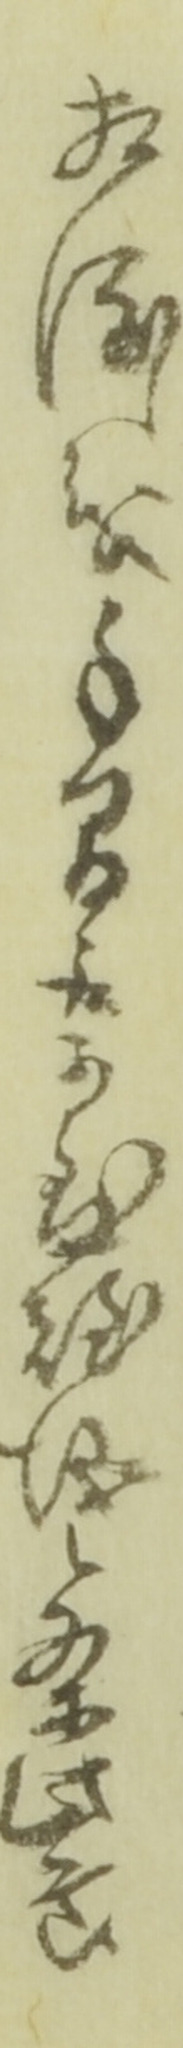相渡候義手間取可致越儀之条此節
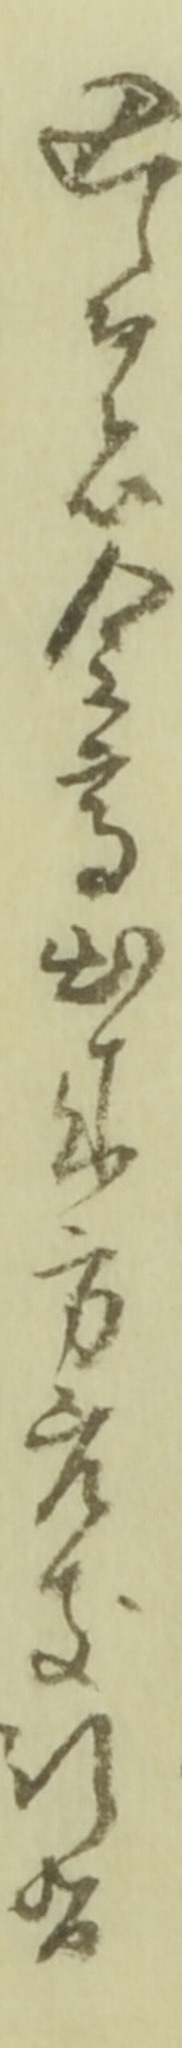込候而者金高出来方差支引替
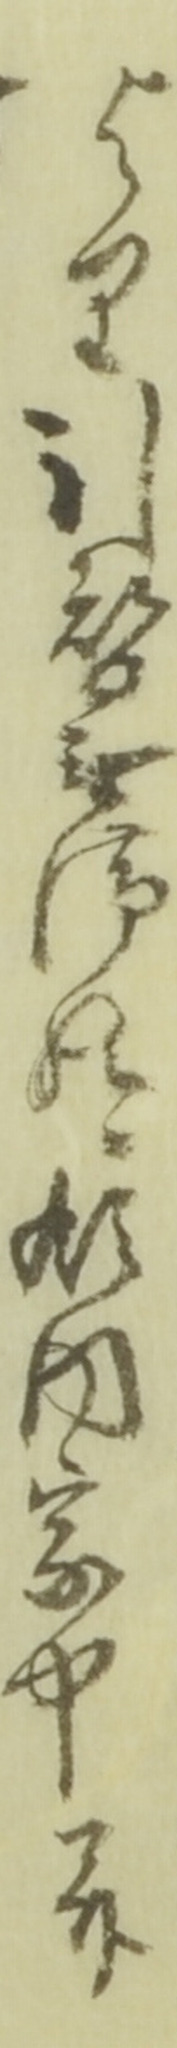より引替無滞様二領内家中並
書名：御公儀様御領主様御触書控
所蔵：伊那市立高遠町図書館・合同会社AMANE
